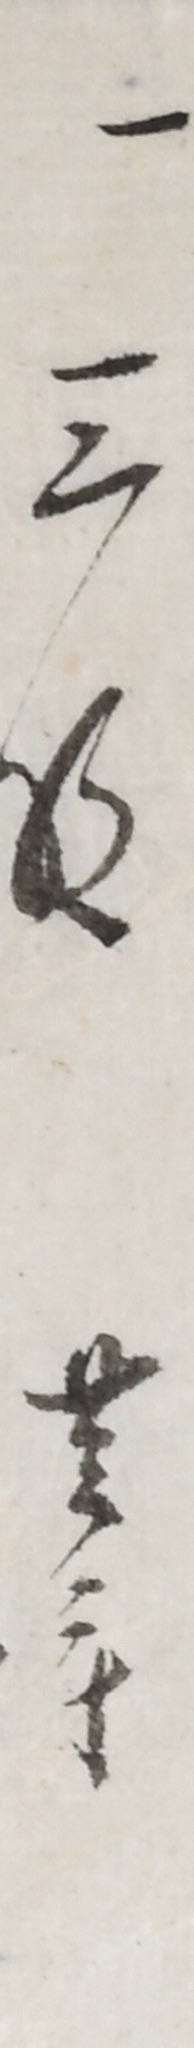一三枚小出
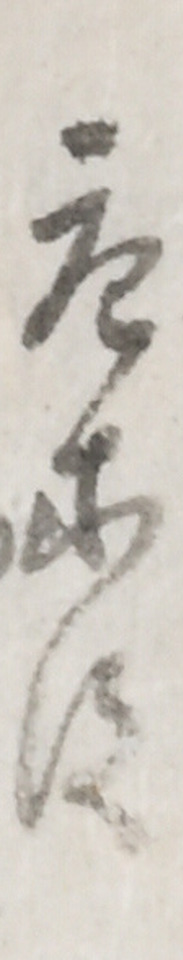唐木沢
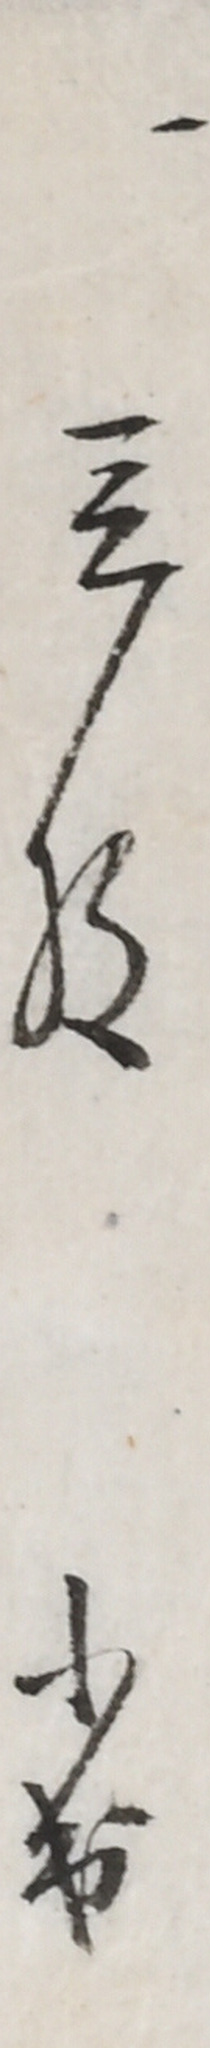一三枚小出
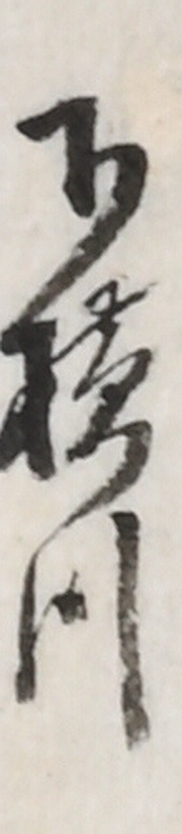下横川
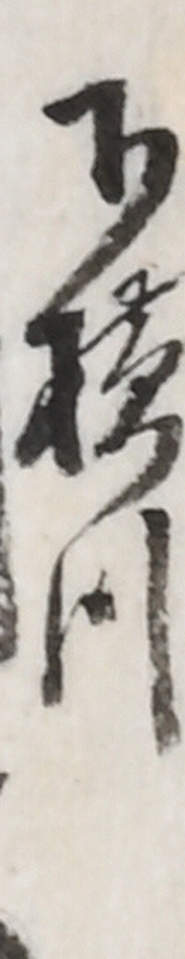下横川
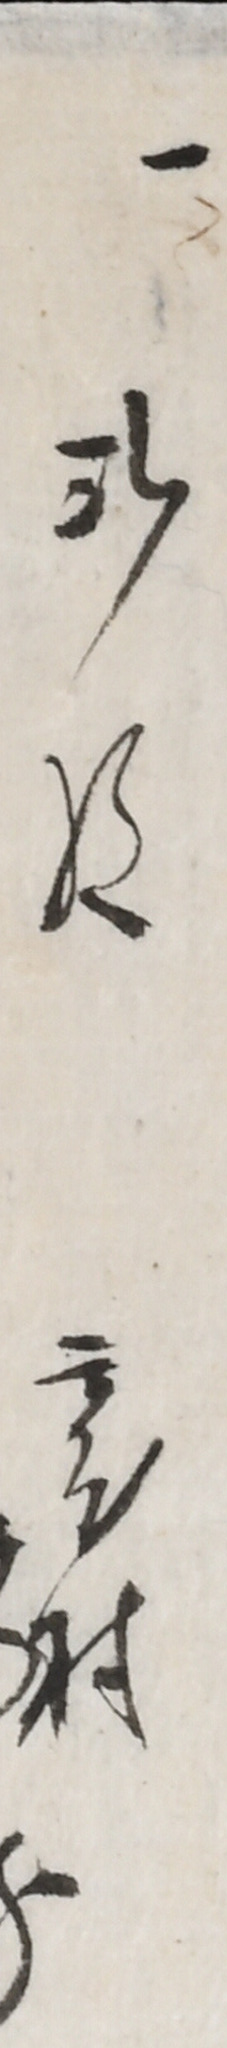一弐枚鉄十
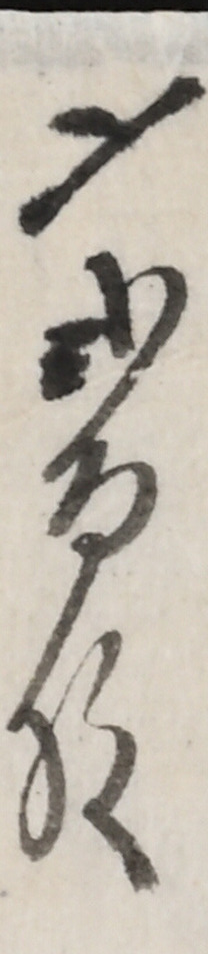〆弐百枚
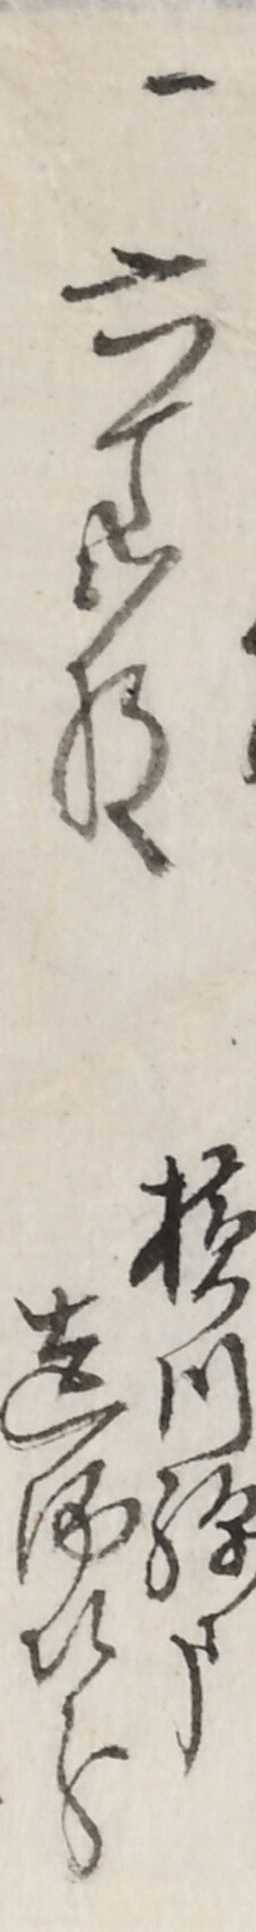一六十弐枚横川筋次分

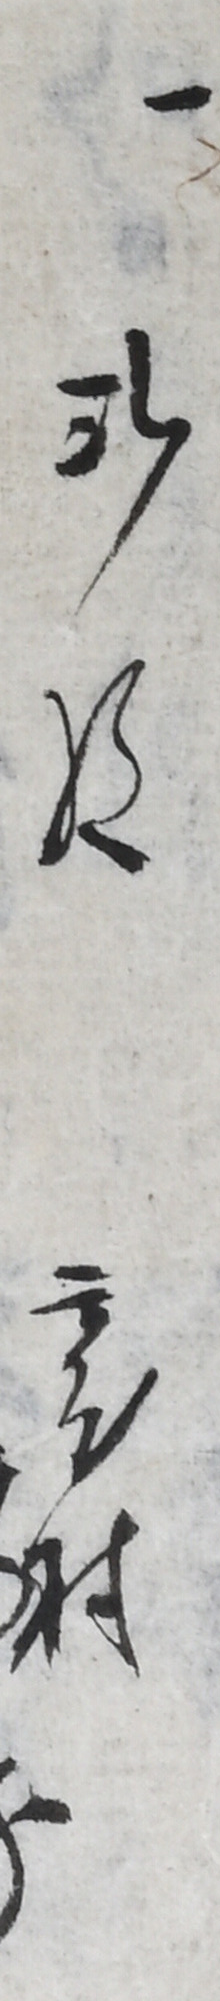一弐枚徳弥
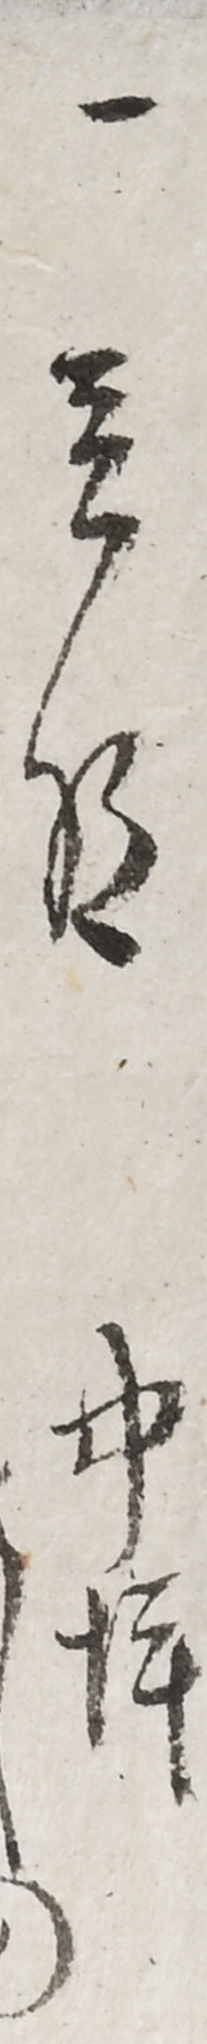一壱枚口光
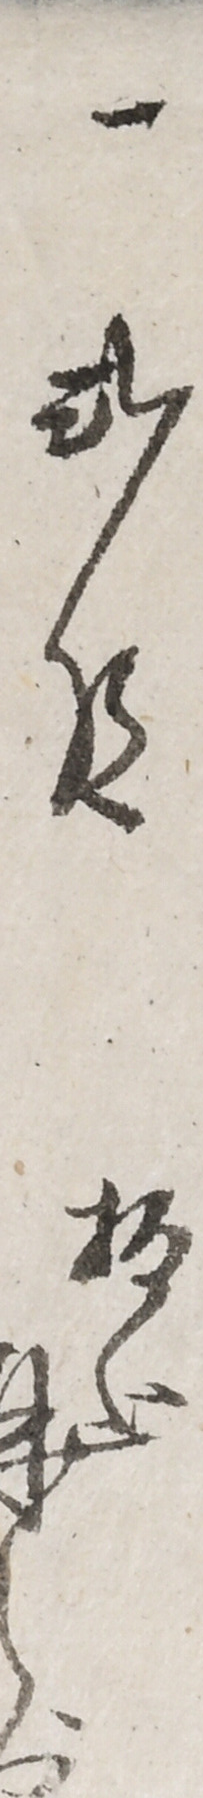一弐枚徳弥
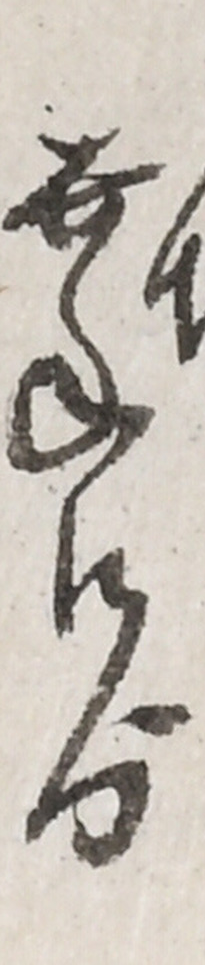一壱枚左衛門
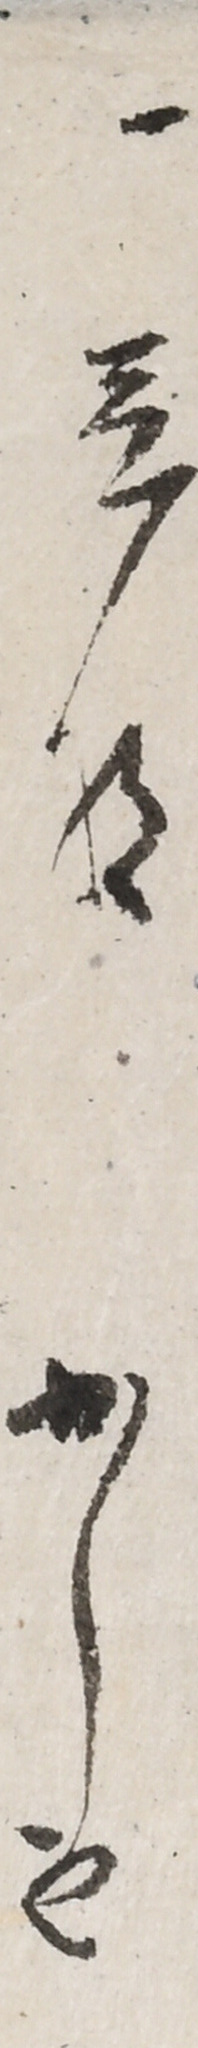一壱枚かしや

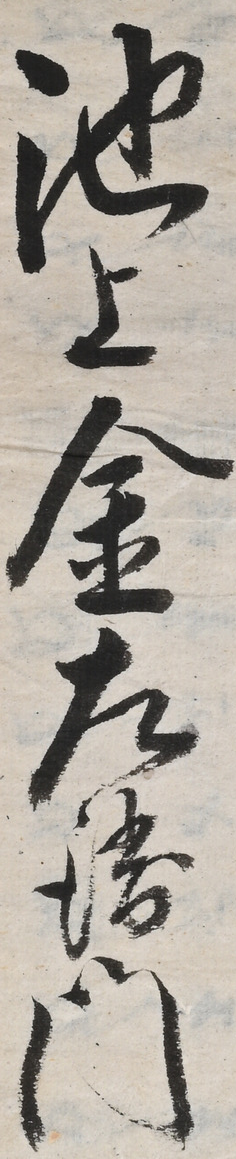池上金左衛門
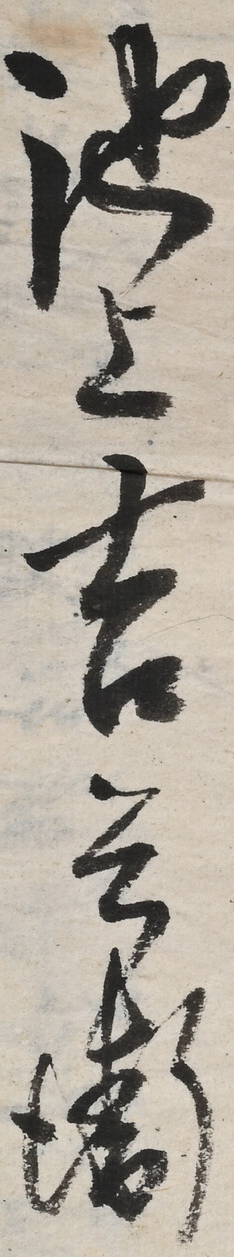池上吉兵衛
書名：髙遠限楮幣引換覚帳
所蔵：伊那市立高遠町図書館・合同会社AMANE
